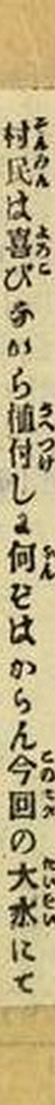村民は喜びながら植付しに何ぞはからん今回の大水にて
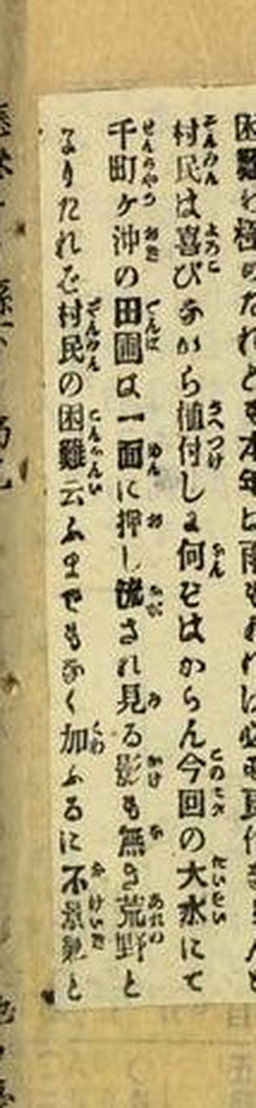千町ヶ沖の田圃は一面に押し流され見る影も無き荒野と
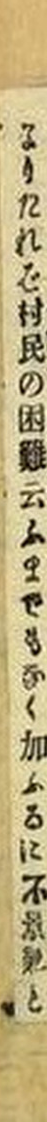なりたれば村民のぎ困難云ふまでもなく加ふるに不景気も
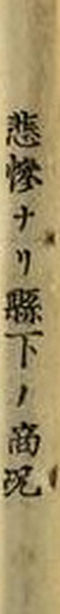悲惨ナリ縣下ノ商况
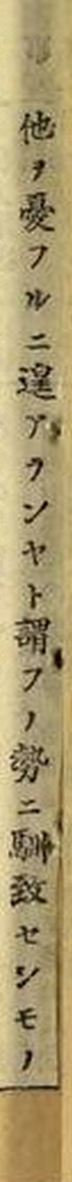他ヲ憂フルニ遑アランヤト謂フノ勢ニ馳致セシモノ
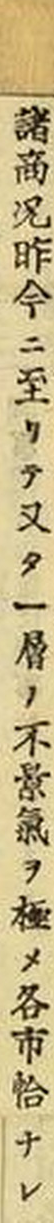諸商况昨今ニ至リテ又タ一層ノ不景氣ヲ極メ各市恰
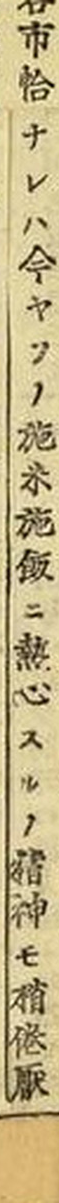ナレハ今ヤソノ施米施飯ニ熱心スルノ精神モ稍倦厭
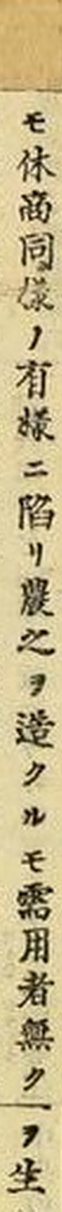モ休商同様ノ有様ニ陷リ農之ヲ造クルモ需用者無ク
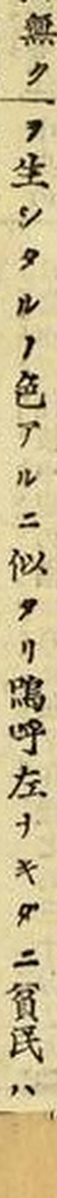ヲ生シタルノ色アルニ似タリ嗚呼左ナキダニ貧民ハ
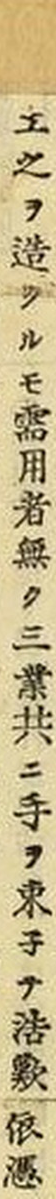工之ヲ造クルモ需用者無ク三業共ニ手ヲ束ネテ浩歎
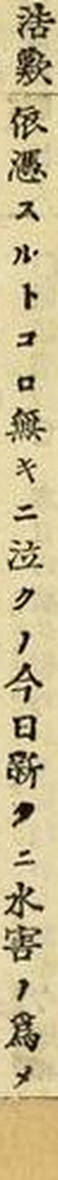依憑スルトコロ無キニ泣クノ今日新タニ水害ノ爲メ
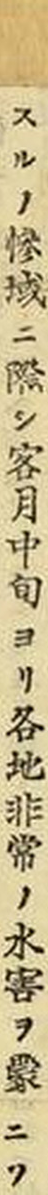スルノ惨域ニ際シ客月中旬ヨリ各地非常ノ水害ヲ蒙
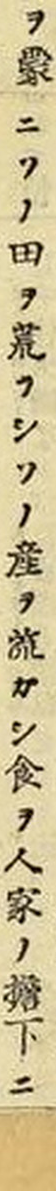ニソノ田ヲ荒ラシソノ産ヲ流ガシ食ヲ人家ノ擔下ニ
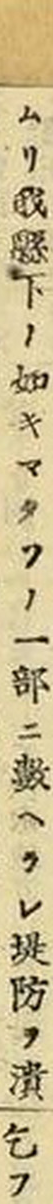ムリ我縣下ノ如キマタソノ一部ニ數ヘラレ堤防ヲ潰
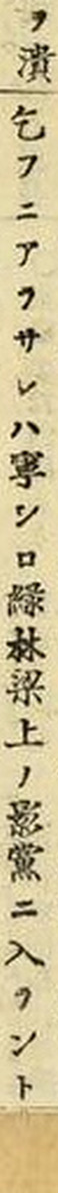乞フニアラサレハ寧シロ緑林梁上ノ影黨ニ入ラント
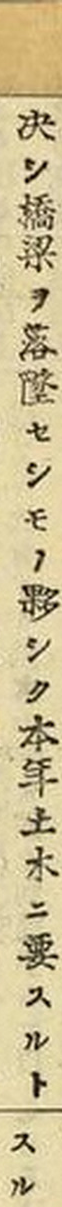决シ橋梁ヲ落墜セシモノ夥シク本年土木ニ要スルト
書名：温古集 五巻
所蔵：福井県文書館 Fukui Prefectural Archives
